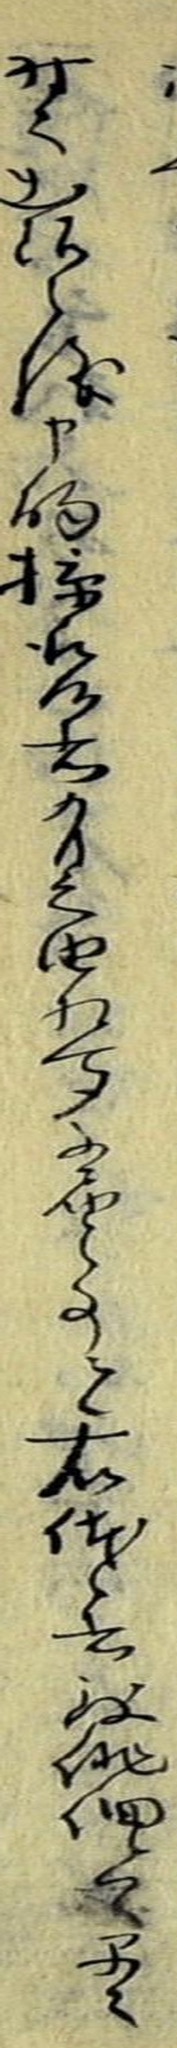村々へ出銀之儀申触掠取候者有之由相聞不届之事に候右体之者致徘徊候はヽ早々
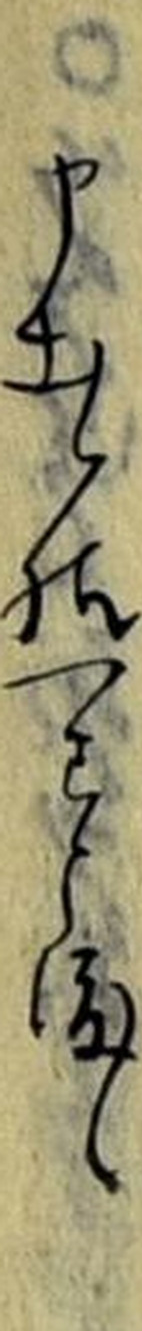申出候様可被申渡候
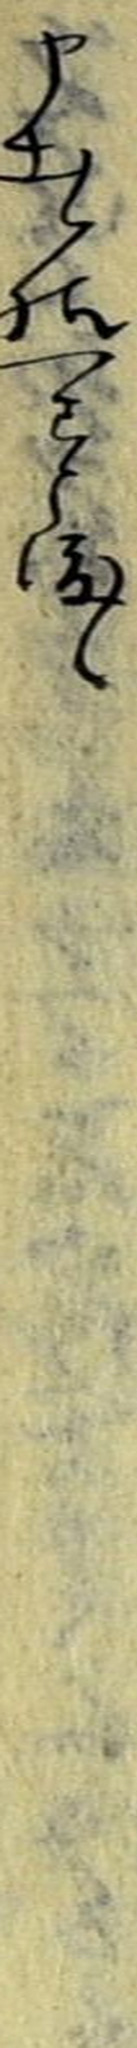申出候様可被申渡候
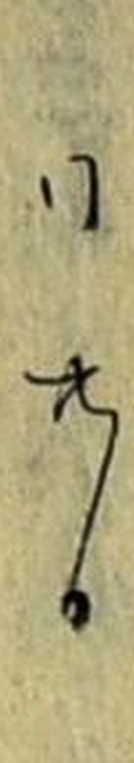同廿日

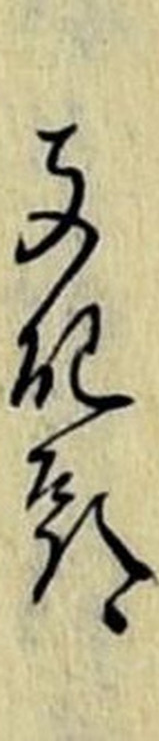支配頭へ
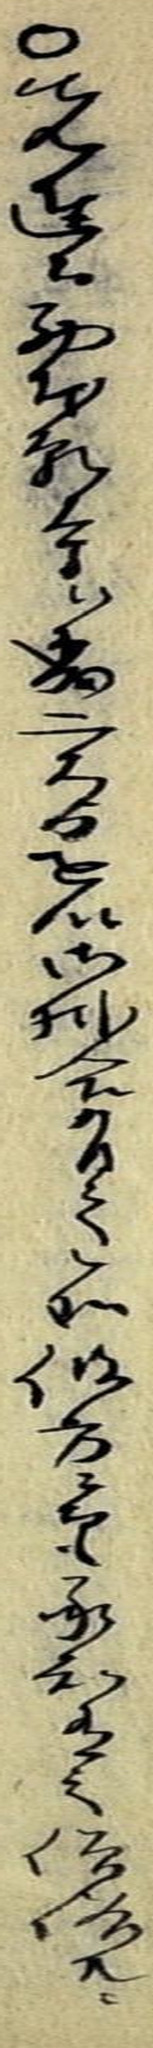○先達而西本願寺は森二右衛門を以御掛合有之候処役方に而も承知有之僧俗共に
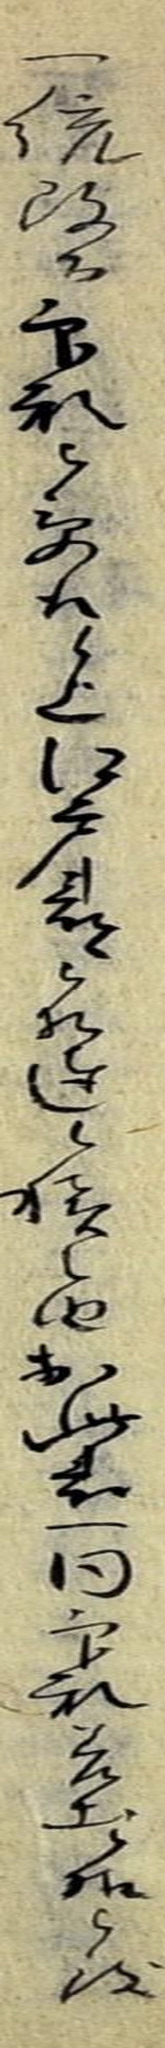一統改而印形被受取候上江戸表へ被相達候積之由於此表一同印形差出候様被致
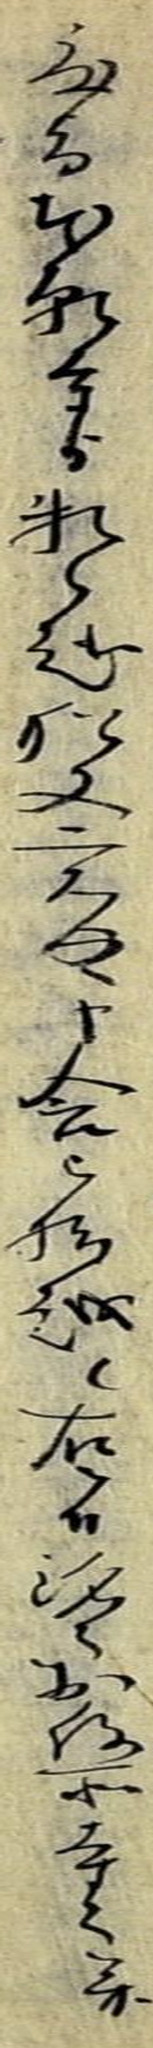度旨本願寺ゟ頼候趣猶又二右衛門へ申合被指越候右に付銘々於役所寺々并
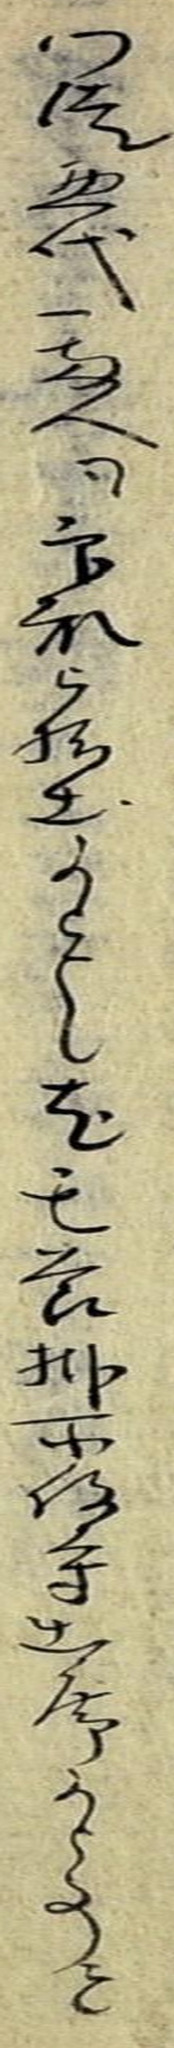門徒惣代一両人ツゝ印形被指出可被申候尤其節掛所役寺出席可申事に候
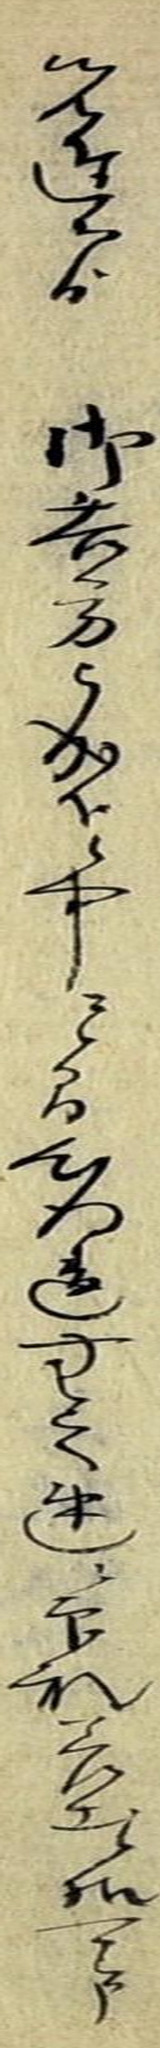先達而ゟ御苦労被成下候事に候間心得違無之速に印形差出候様可申
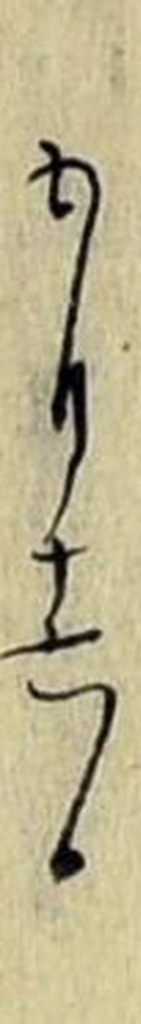五月十一日
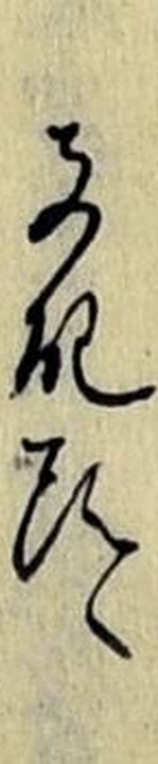支配頭へ
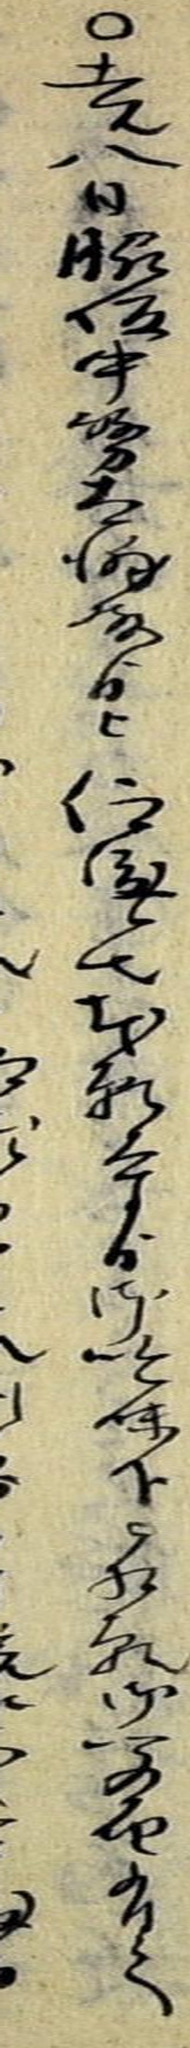○去ル八日脇坂中務太輔殿ゟ被仰渡候は本願寺ゟ御吟味下被相願御聞届有之
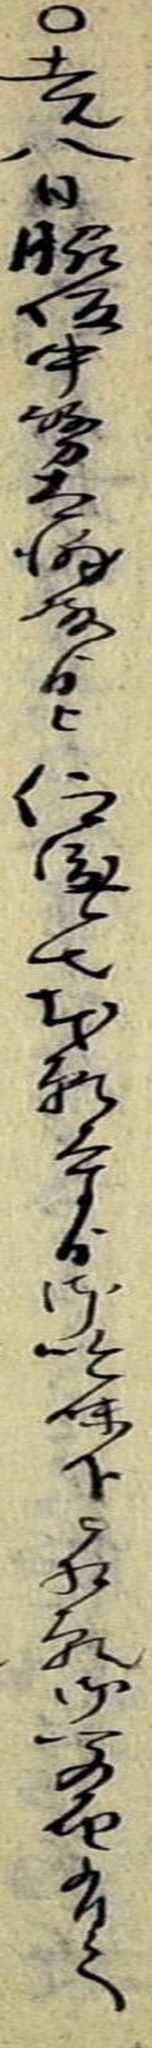○去ル八日脇坂中務太輔殿ゟ被仰渡候は本願寺ゟ御吟味下被相願御聞届有之
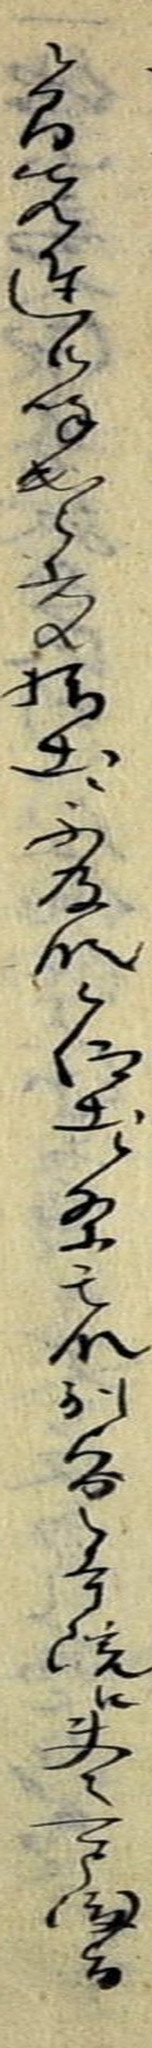候間先達御呼出之者共指出に不及段被仰出候条其段別紙之寺院へ夫々可申渡旨
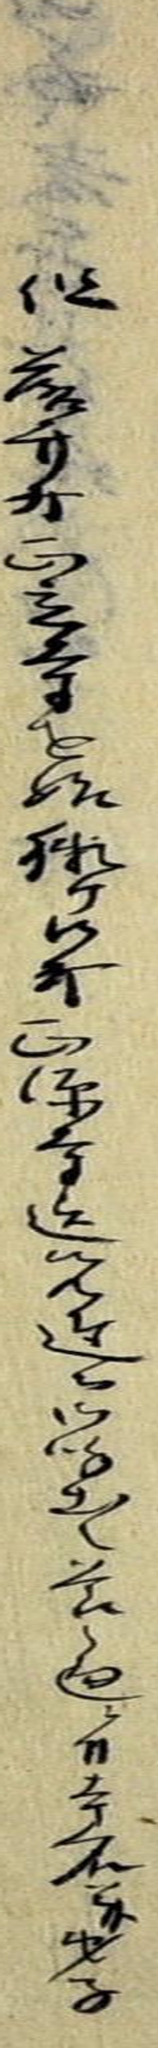但落井村正立寺を始獺ヶ口村正源寺迄先達而御呼出之節之通に付寺名并弟子
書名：命令之部 四
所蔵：福井県文書館 Fukui Prefectural Archives
